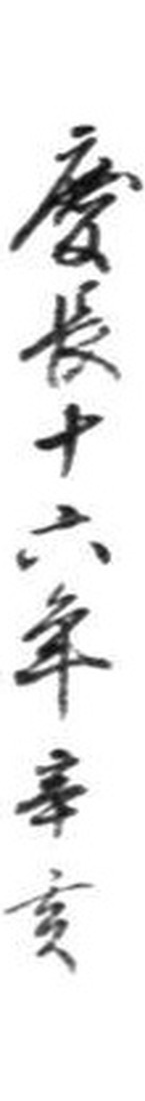慶長十六年辛亥
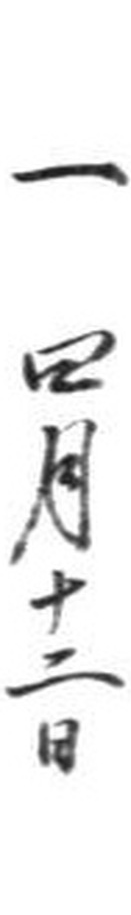一四月十二日

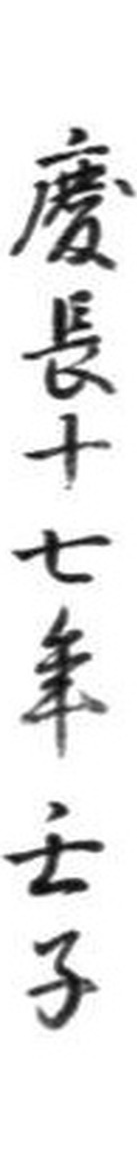慶長十七年壬子
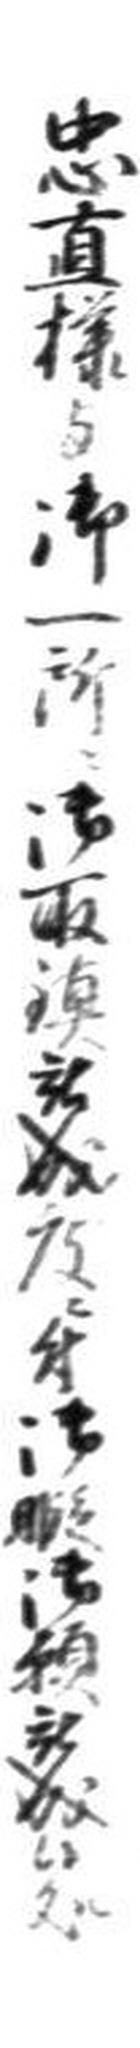忠直様と御一所ニ御取鎮被成度ニ付御暇御願被成候処
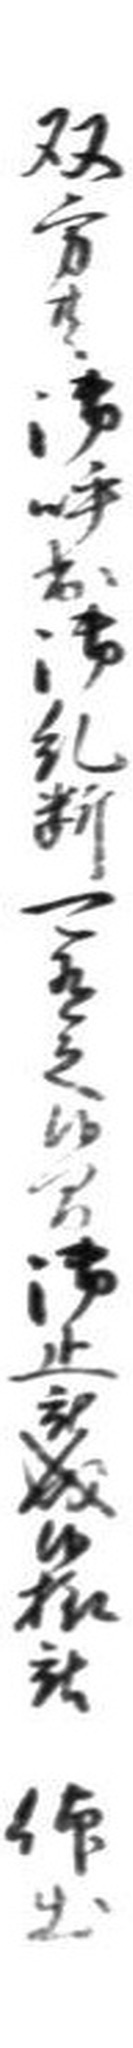双方共御呼出御糺断可有之候間御止被成候様被仰出

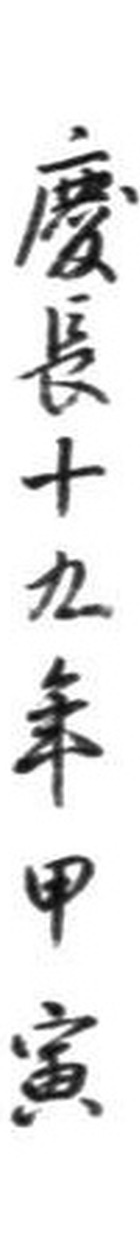慶長十九年甲寅
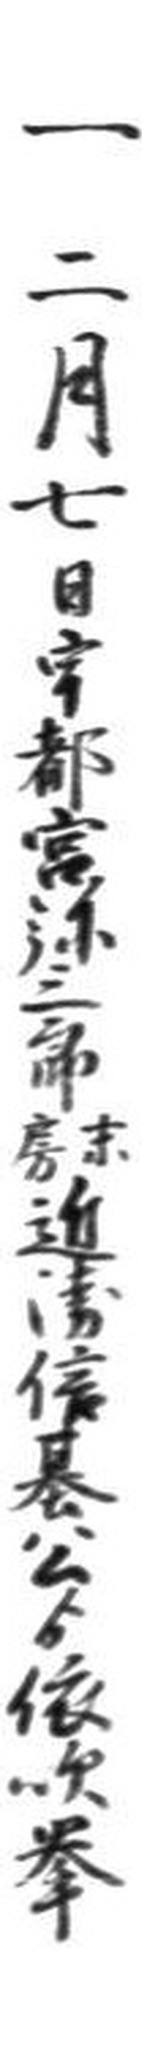一二月七日宇都宮弥三郎末房近衛信基公ゟ依吹挙
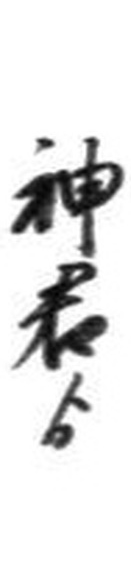神君ゟ
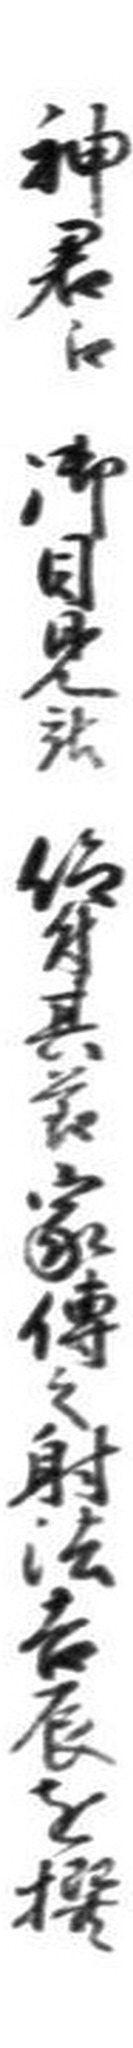神君江御目見被仰付其節家伝之射法吉辰を撰
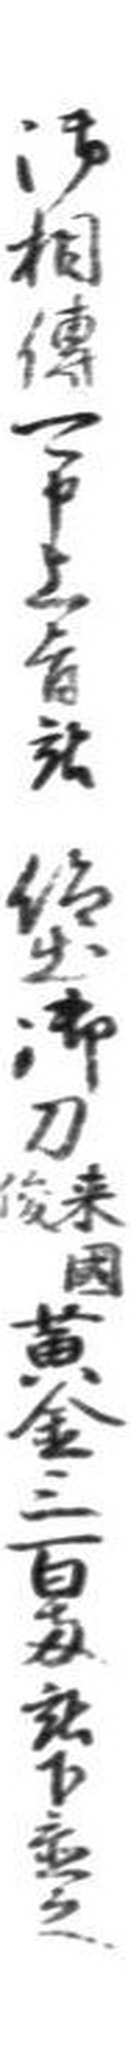御相伝可申上旨被仰出御刀来国俊黄金三百両被下置之
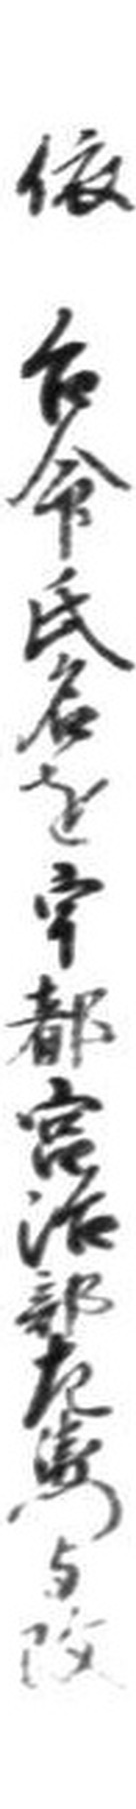依台命氏名を宇都宮治部左衛門と改

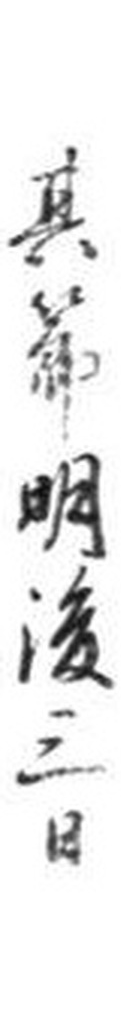其節明後三日
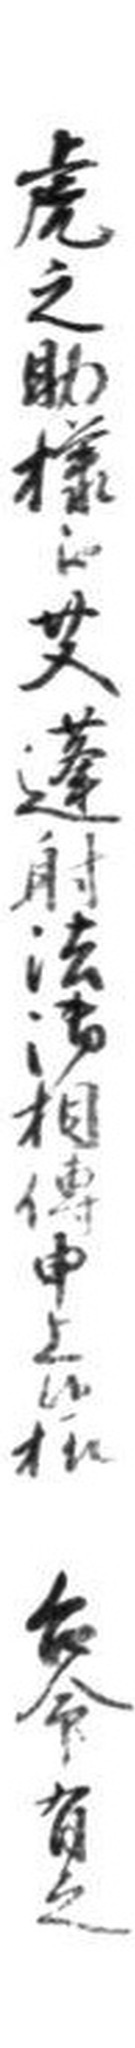虎之助様江艾蓬射法御相伝申上候様台命有之
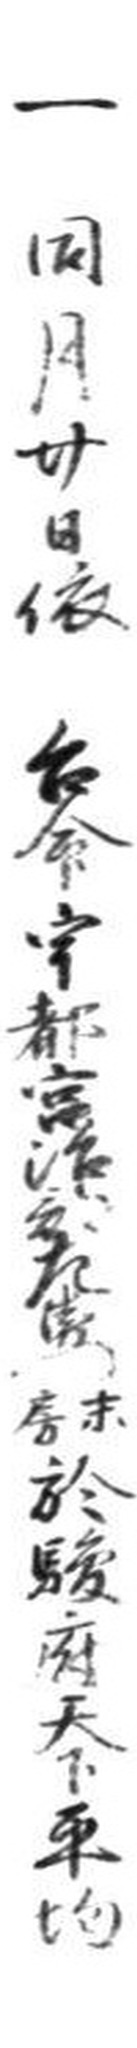一同月廿日依台命宇都宮治部左衛門末房於駿府天下平均
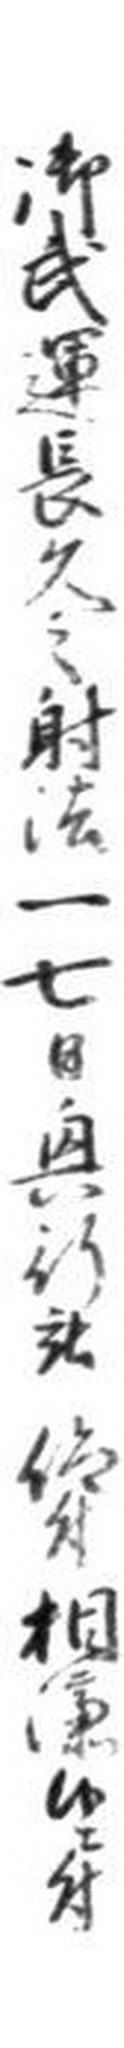御武運長久之射法一七日興行被仰付相済候ニ付
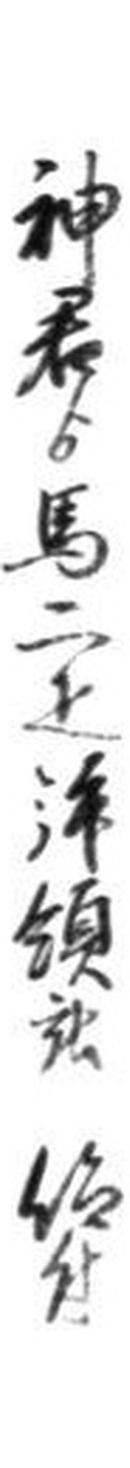神君ゟ馬二疋拝領被仰付
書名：家譜 三 忠昌公 従慶長八年到寛永六年
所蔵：福井県文書館 Fukui Prefectural Archives
